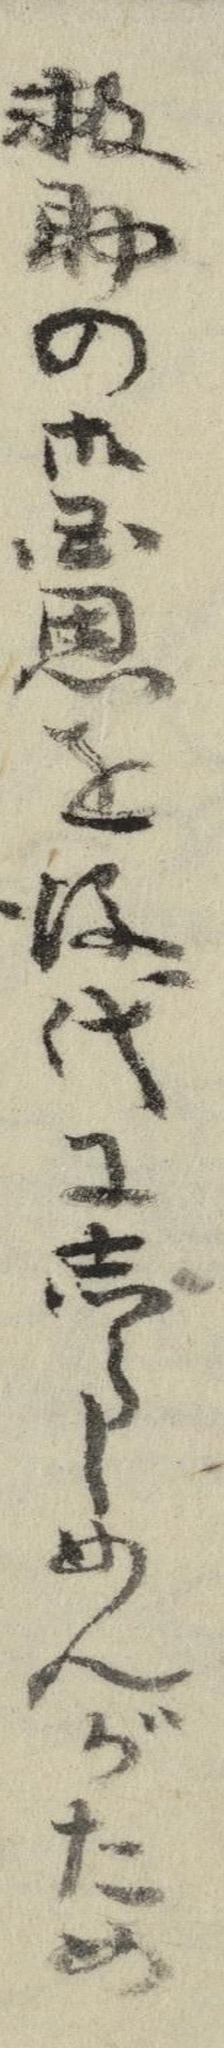救助の御国恩を後代にしらしめんがため
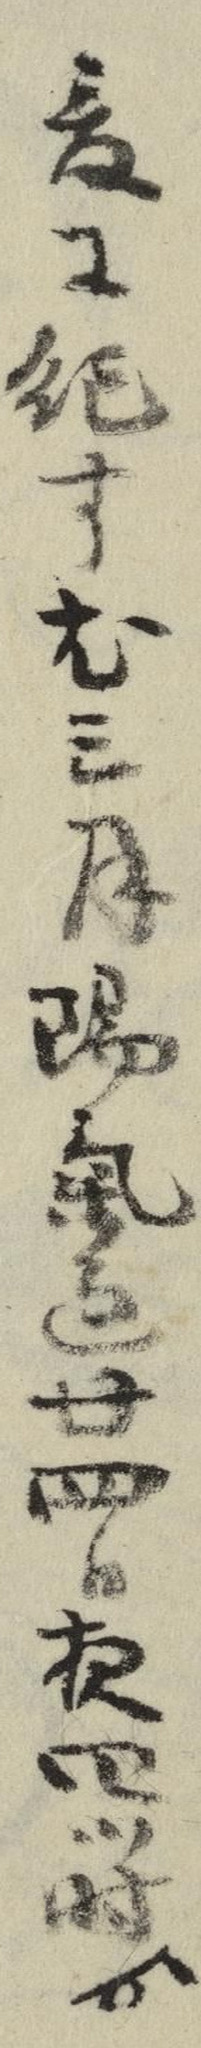爰に紀す尤三月陽気過廿四日夜四ッ時ゟ
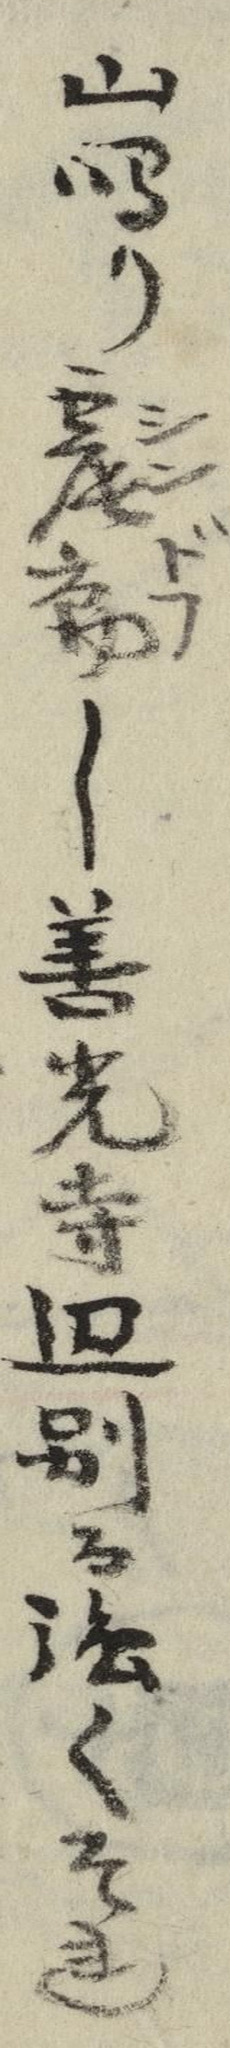山鳴り震動し善光寺辺別而強くそれ
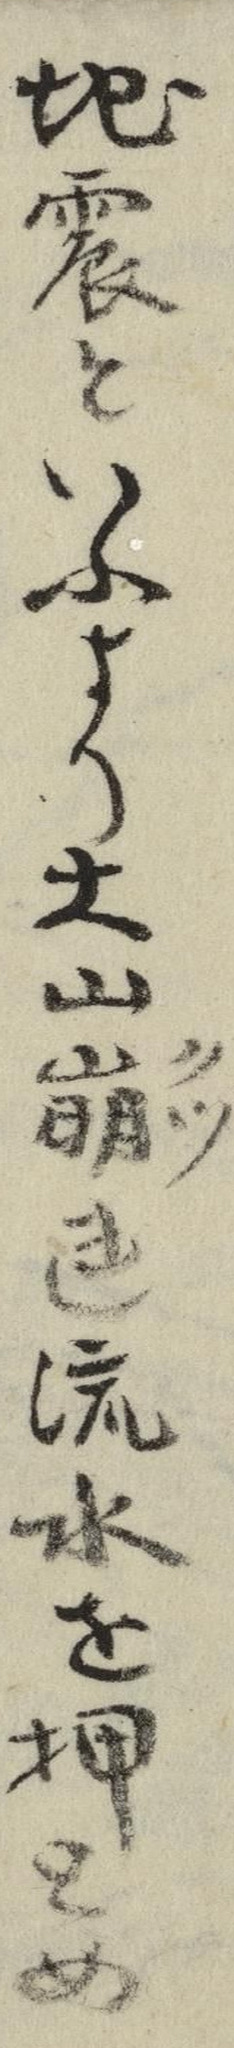地震といふより大山崩れ流水を押とめ
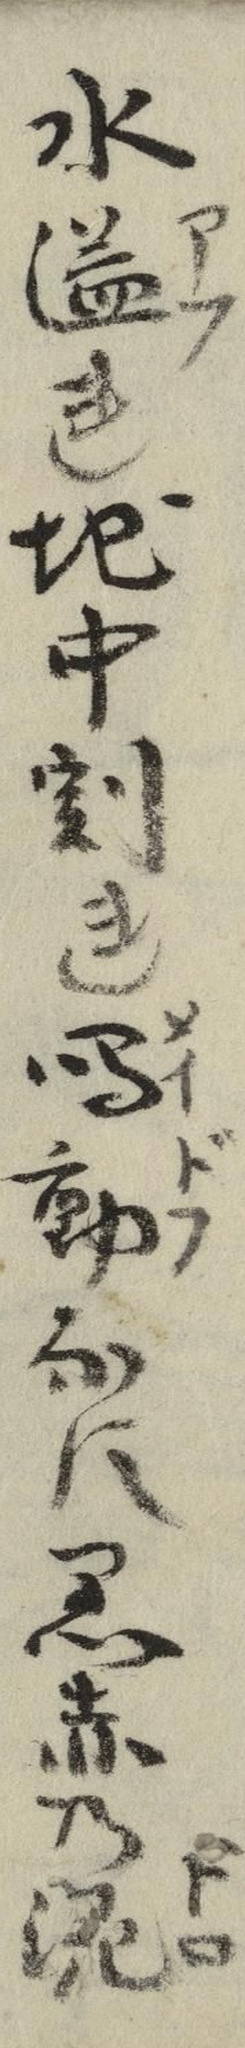水溢れ地中割れ鳴動なす黒赤乃泥
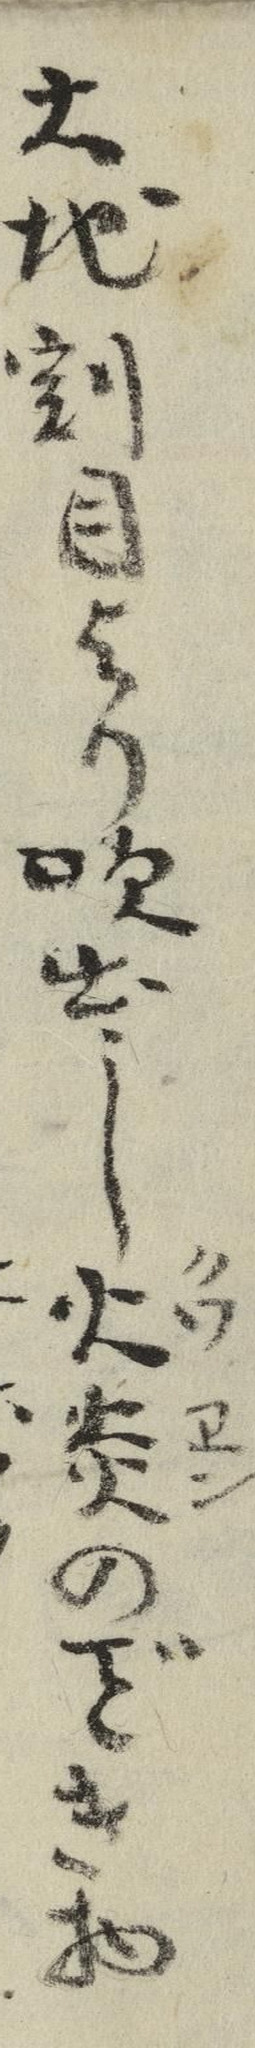大地割目より吹出し火炎のごとき物
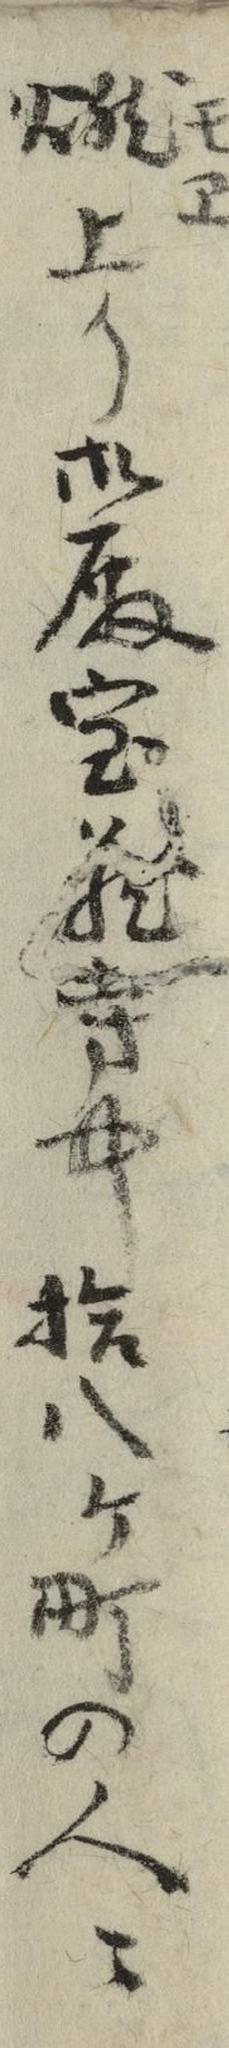燃上り御殿宝蔵寺中拾八ヶ町の人々
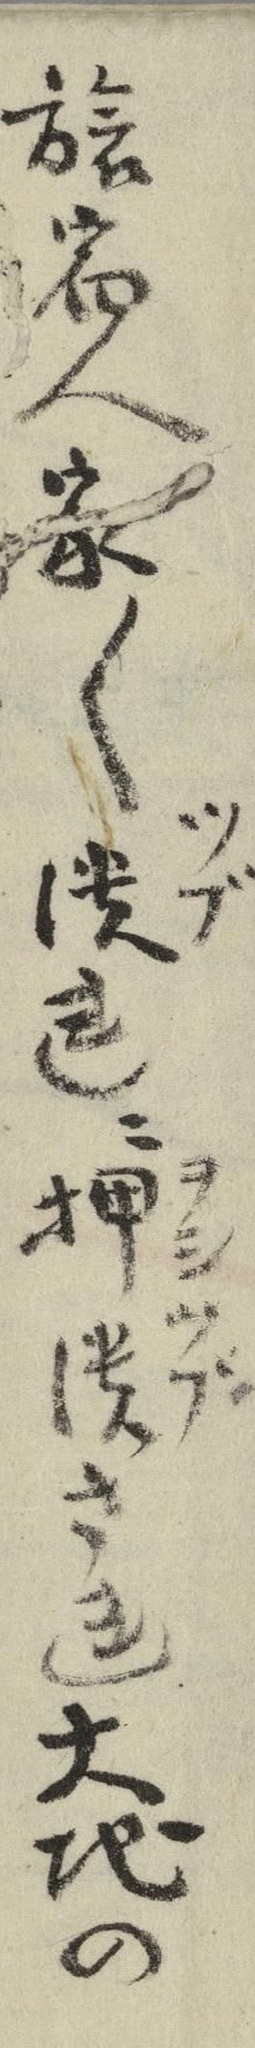旅宿人家々潰れ二押潰され大地の
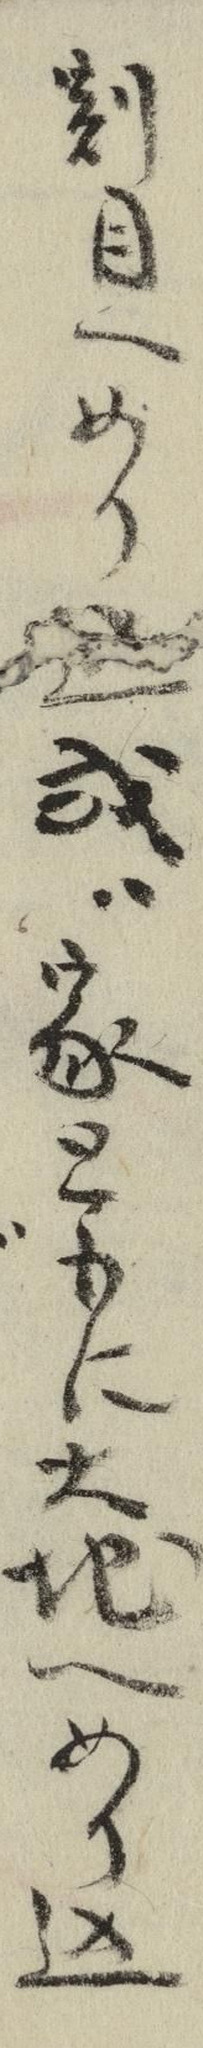割目へめり込或ハ家ともに大地へめり込
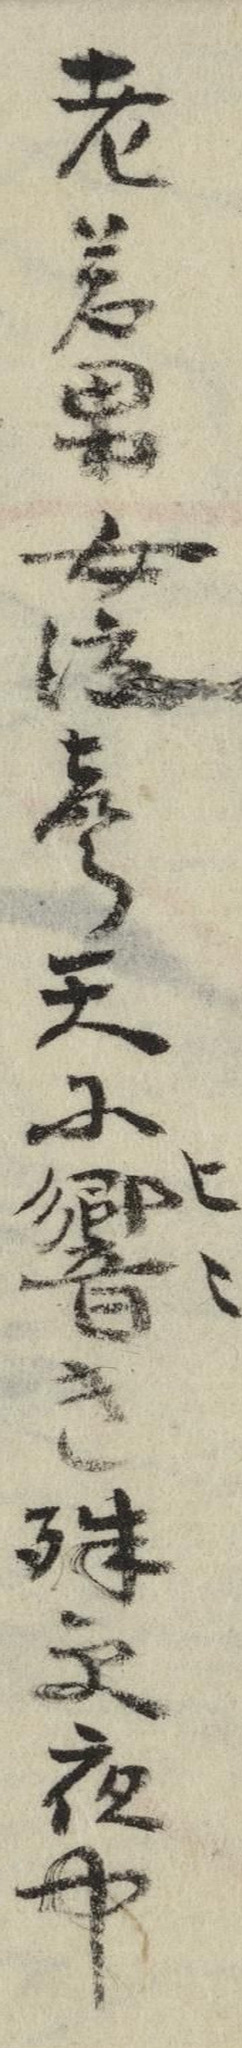老若男女泣声天に響き殊更夜中
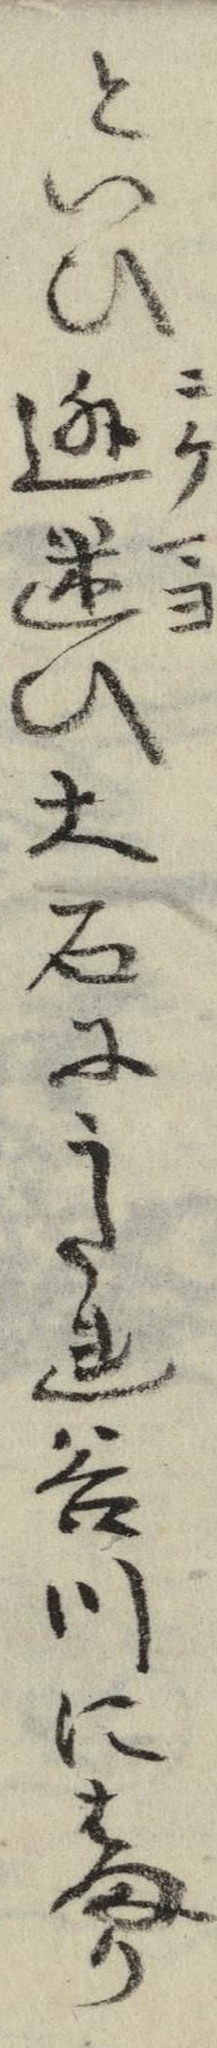といひ逃迷ひ大石にうたれ谷川にはまり
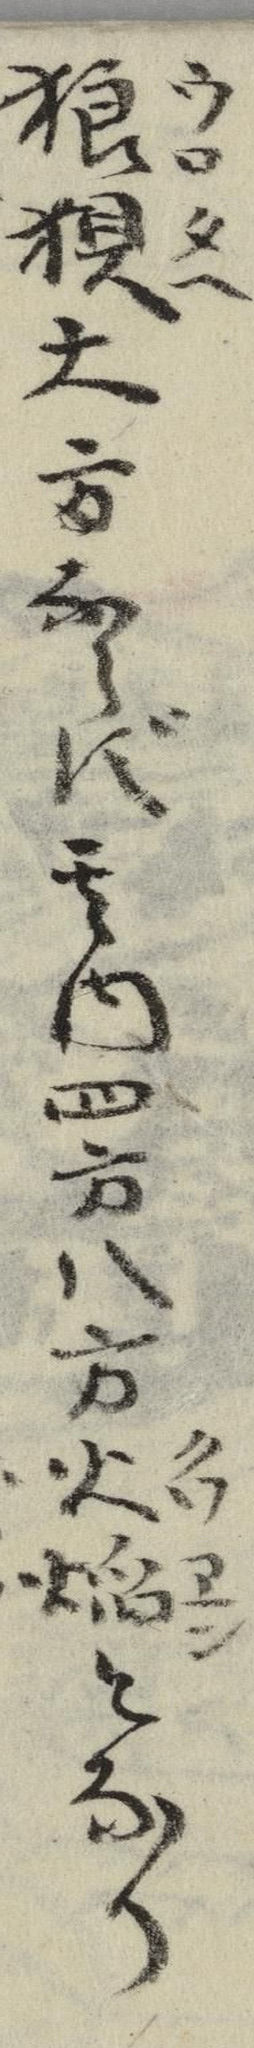狼狽大方ならず其内四方八方火焔となり
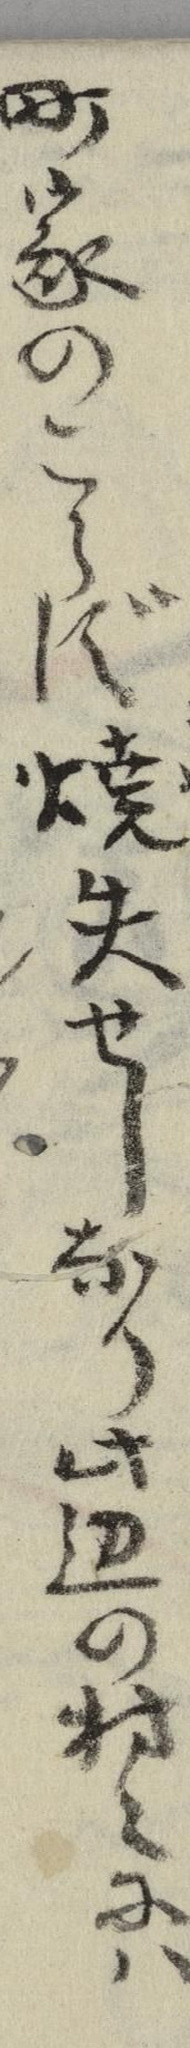町家のこらず焼失せしなり此辺の村々にハ
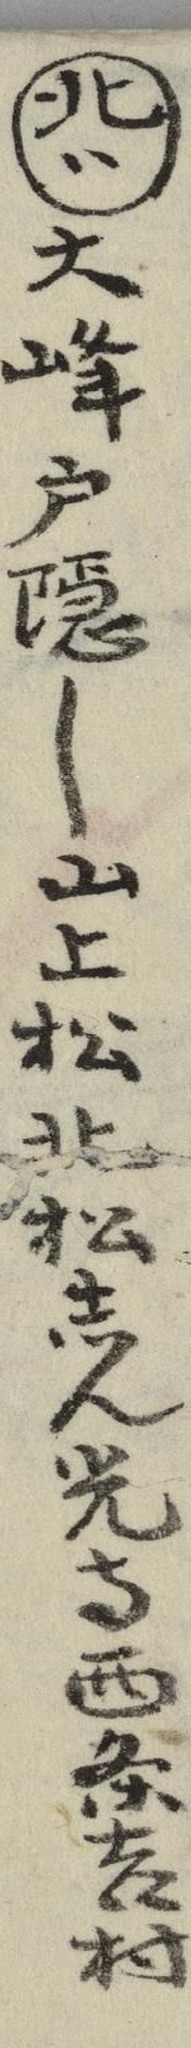北ハ大峰戸隠し山上松北松しん光寺西条吉村
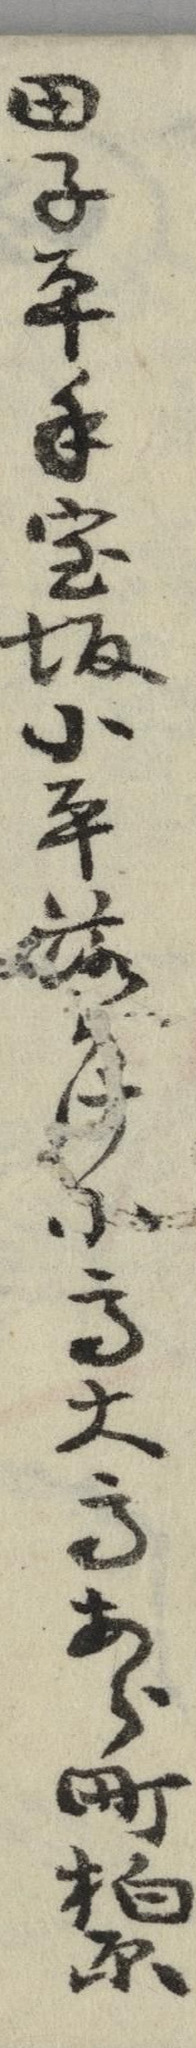田子平手室坂小平落かけ小馬大馬あら町柏原
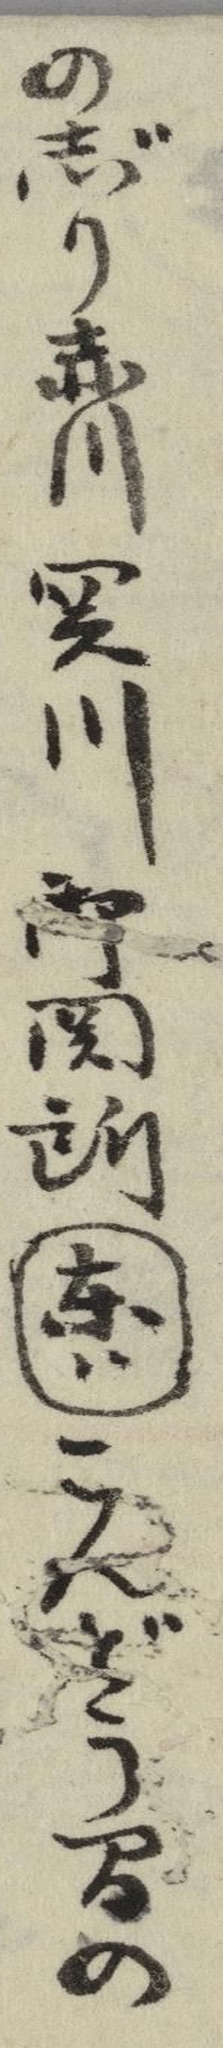のじり赤川関川御関所東ハこんどう間の
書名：信州大地震一件之冩　丁未弘化四年三月吉日
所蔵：東京大学地震研究所図書室 Earthquake Research Institute Library, The University of Tokyo, JAPAN
